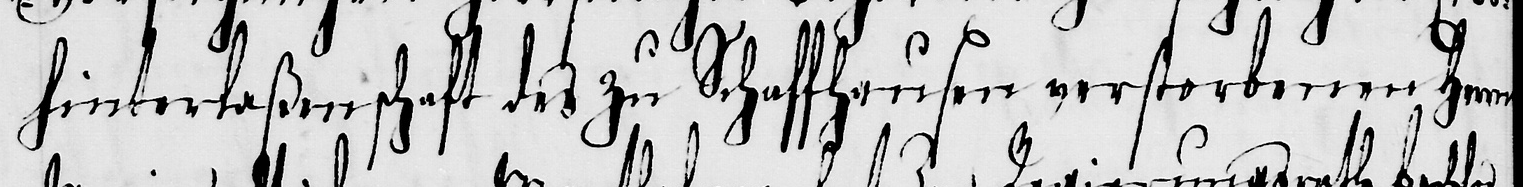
hinterlaßenschaft des zu Schaffhausen verstorbenen Her¬
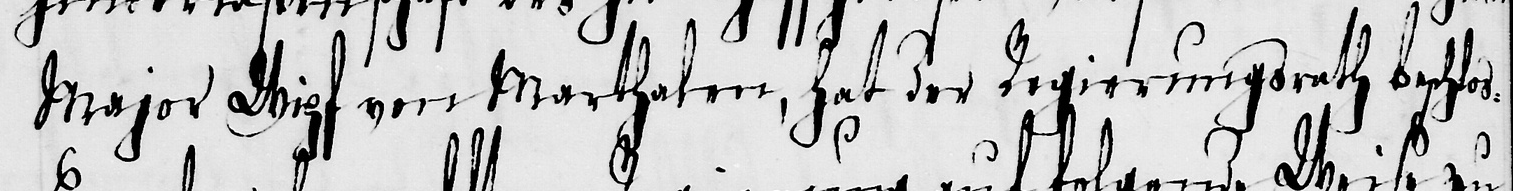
Major Wipf von Marthalen, hat der Regierungsrath beschl¬
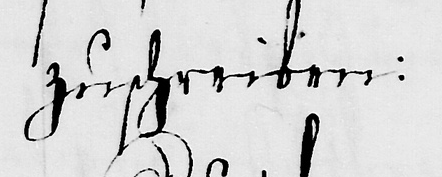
zuschreiben:
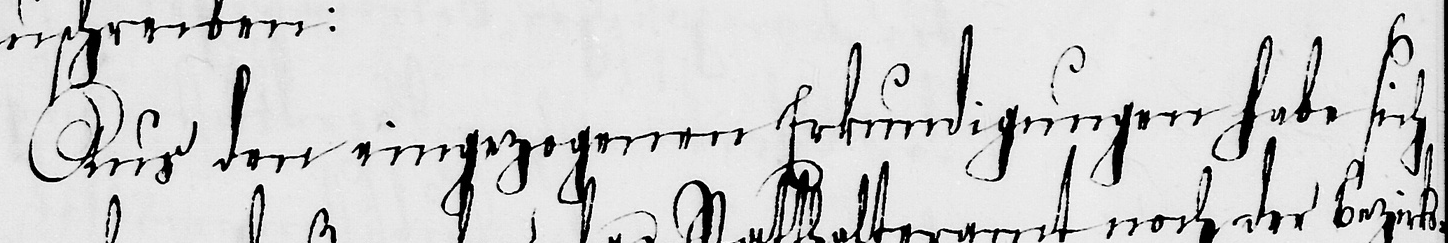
Aus den eingezogenen Erkundigungen habe sich
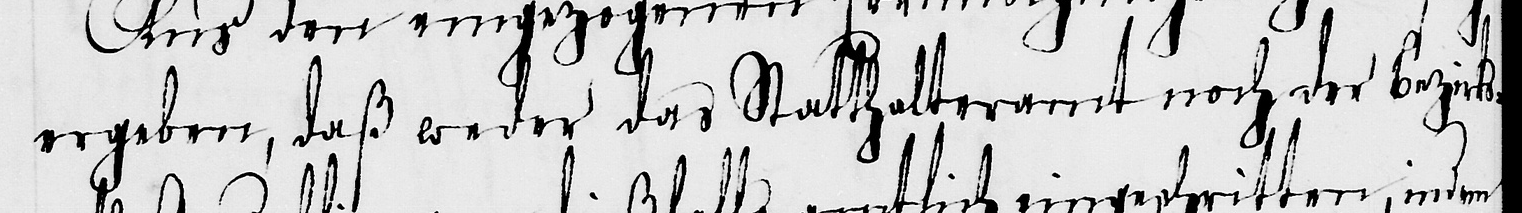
ergeben, daß weder das Statthalteramt noch der Bezirks¬
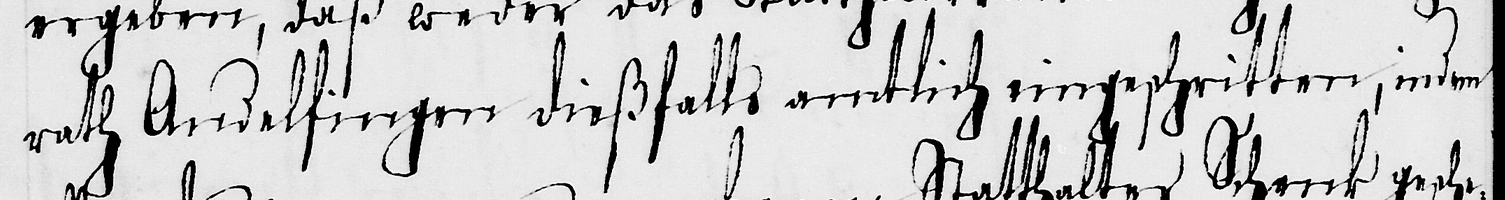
rath Andelfingen dießfalls amtlich eingeschritten, indem
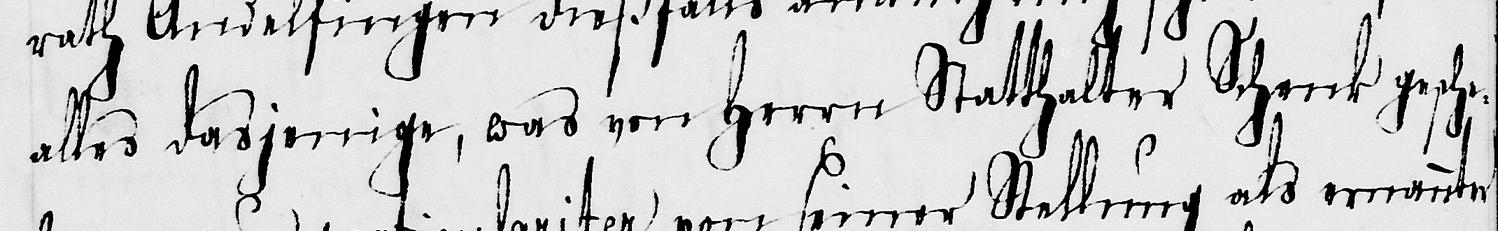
alles dasjenige, was von Herrn Statthalter Schenk gesch¬
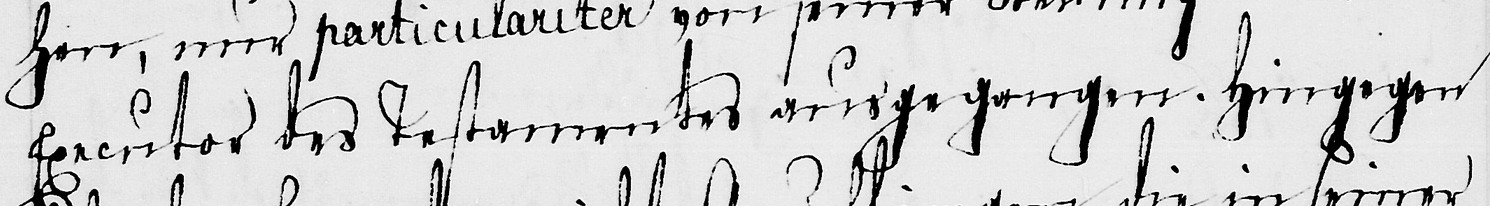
Executor des Testamentes ausgegangen. Hingegen
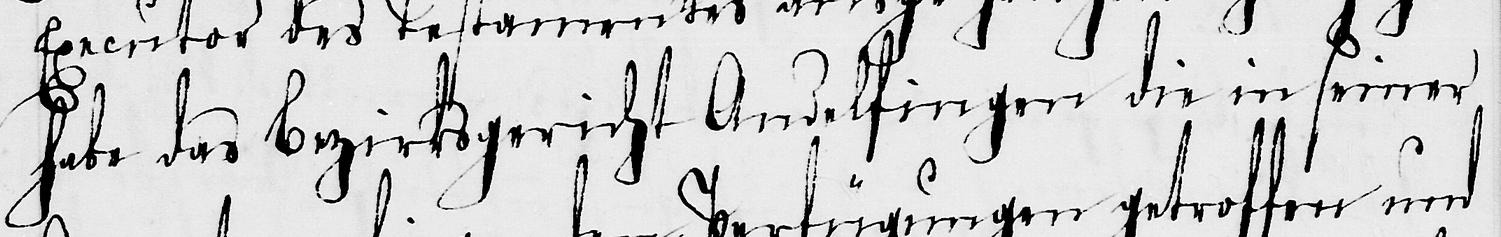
habe das Bezirksgericht Andelfingen die in seiner
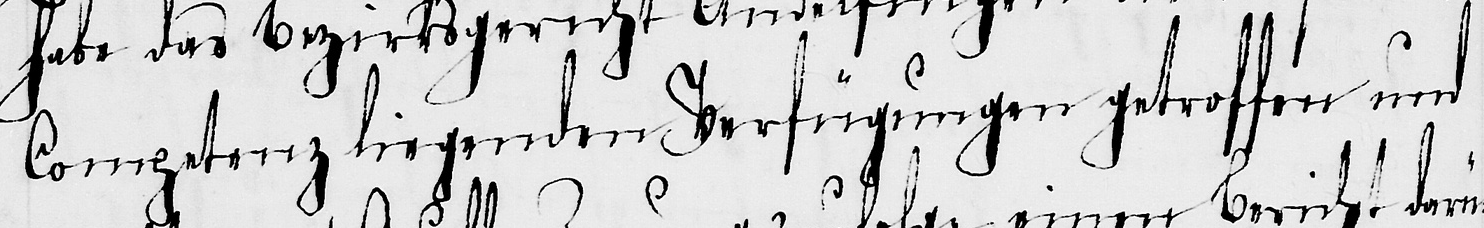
Competenz liegenden Verfügungen getroffen und
